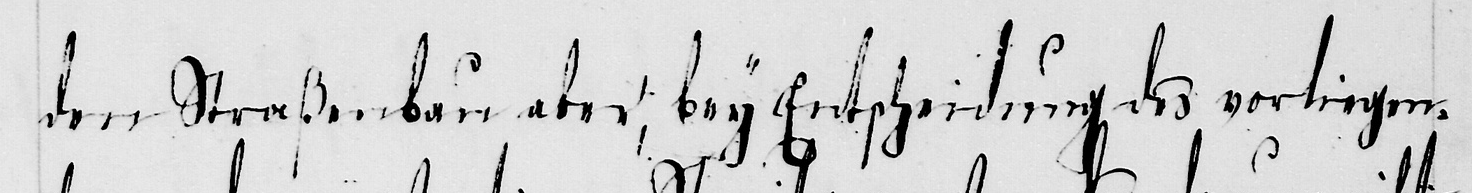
den Straßenbau aber, bey Entscheidung des vorliegen¬
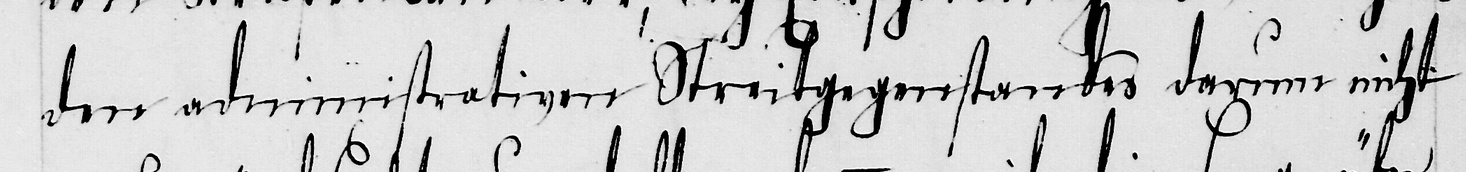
den administrativen Streitgegenstandes darum nicht
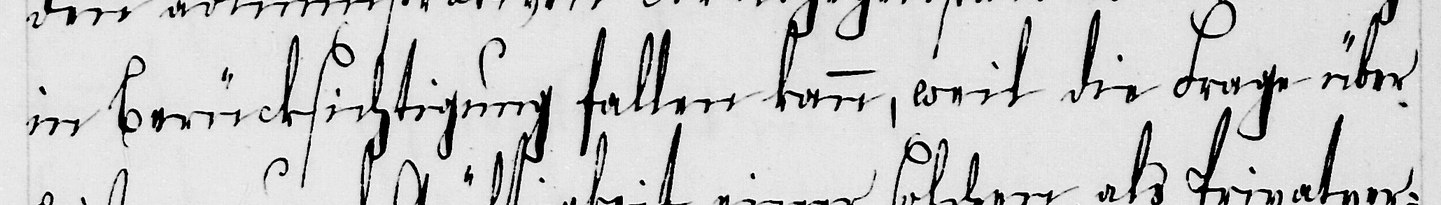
in Berücksichtigung fallen kann, weil die Frage über
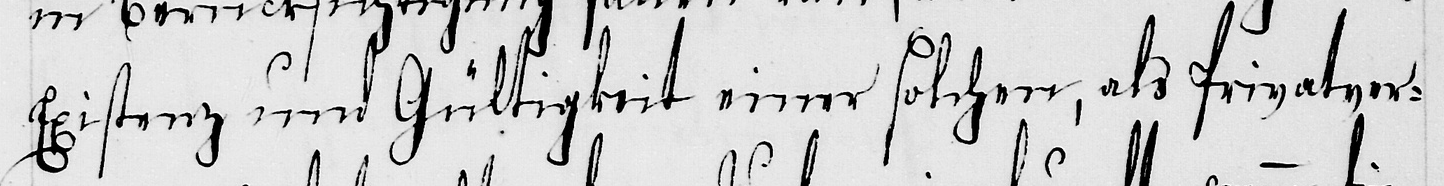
Existenz und Gültigkeit einer solchen, als Privatver¬
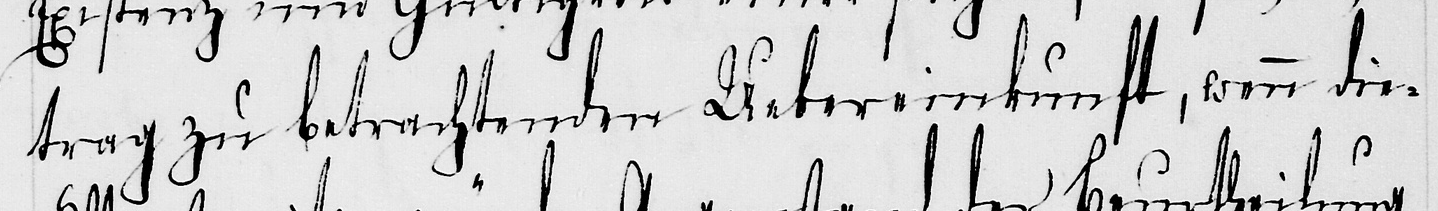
trag zu betrachtenden Uebereinkunft, wenn die¬
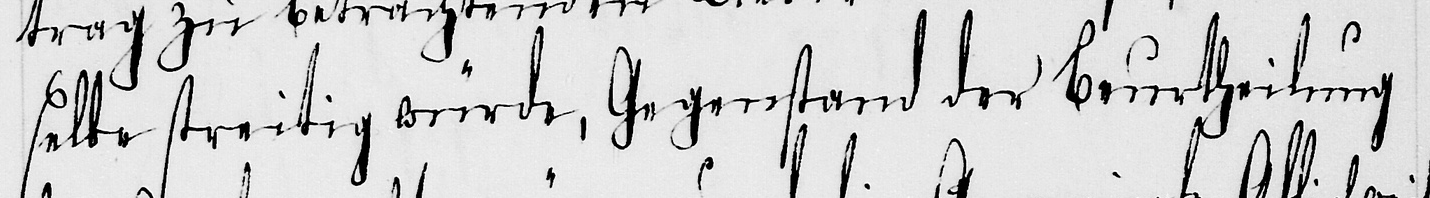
selbe streitig würde, Gegenstand der Beurtheilung
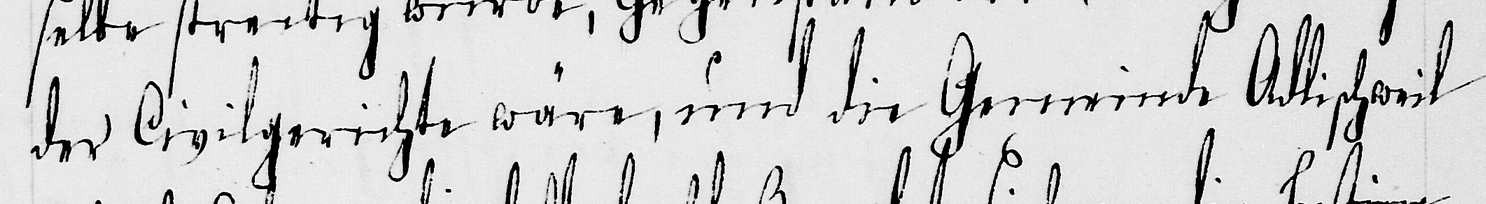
der Civilgerichte wäre, und die Gemeinde Adlischweil
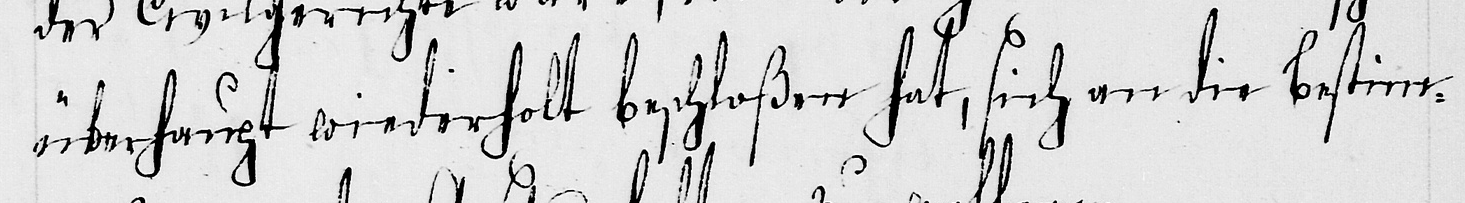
überhaupt wiederholt beschloßen hat, sich an die Bestim¬
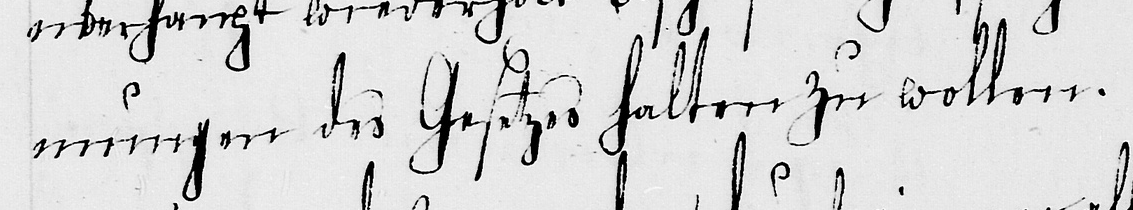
mungen des Gesetzes halten zu wollen.
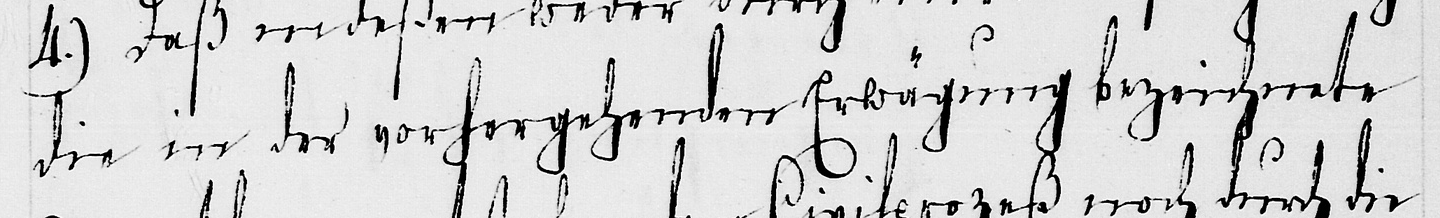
die in der vorhergehenden Erwägung bezeichnete
